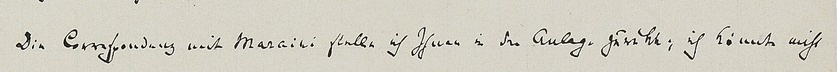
Die Correspondenz mit Maraini stelle ich Ihnen in der Anlage zurükk; ich könnte nicht
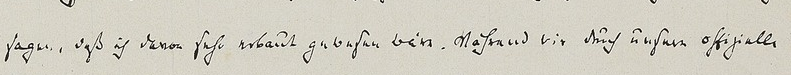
sagen, daß ich davon sehr erbaut gewesen wäre. Während wir durch unsere offizielle
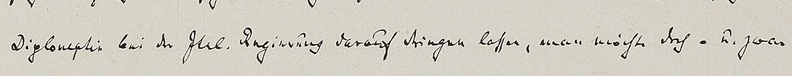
Diplomatie bei der Ital. Regierung darauf dringen lassen, man möchte doch – u. zwar
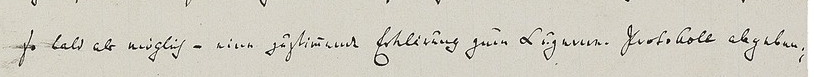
so bald als möglich – eine zustimmende Erklärung zum Luzerner Protokoll abgeben;
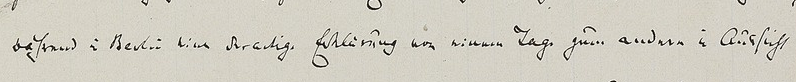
während in Berlin eine derartige Erklärung von einem Tage zum andern in Aussicht
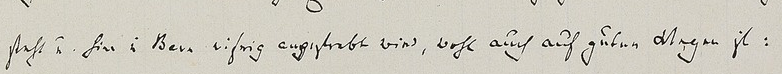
steht u. hier in Bern eifrig angestrebt wird, wohl auch auf guten Wegen ist:
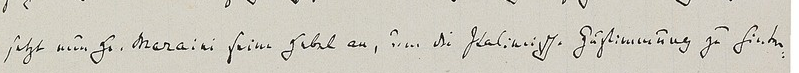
setzt nun Hr. Maraini seine Hebel an, um die Italienische Zustimmung zu hinter-
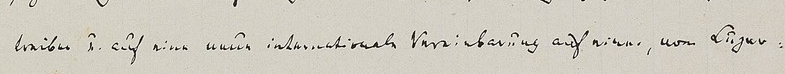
treiben u. auf eine neue internationale Vereinbarung auf einer, vom Luzer-
